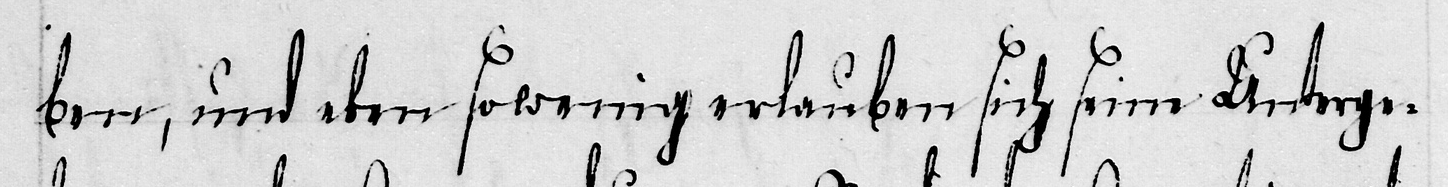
ben, und eben so wenig erlauben sich seine Unterge¬
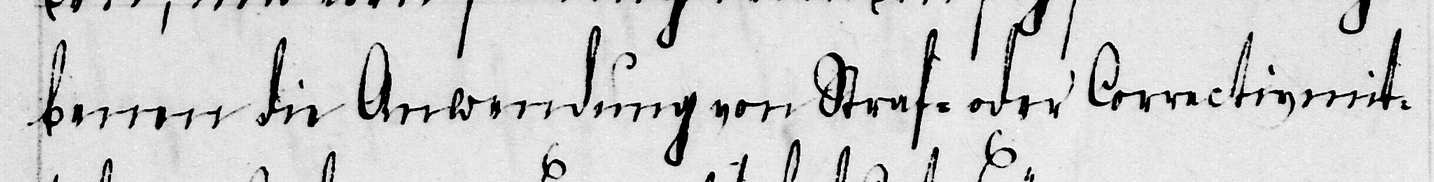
benen die Anwendungen von Straf- oder Correctivmit¬
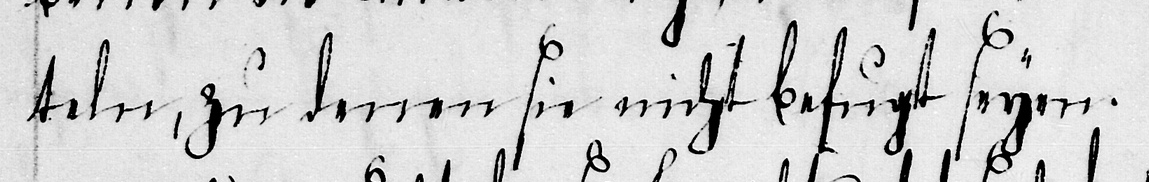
teln, zu denen sie nicht befugt seyen.
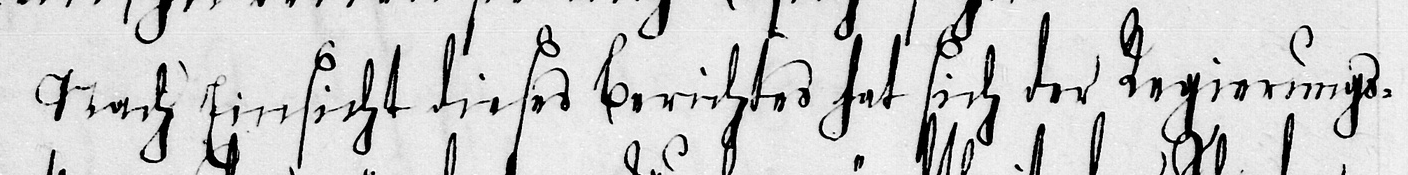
Nach Einsicht dieses Berichtes hat sich der Regierungs¬
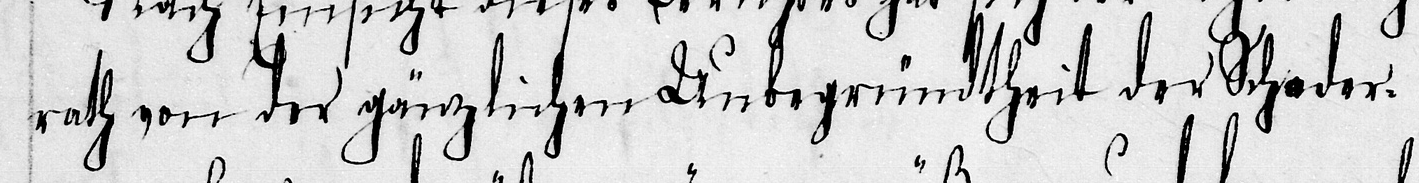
rath von der gänzlichen Unbegründetheit der Schoder¬
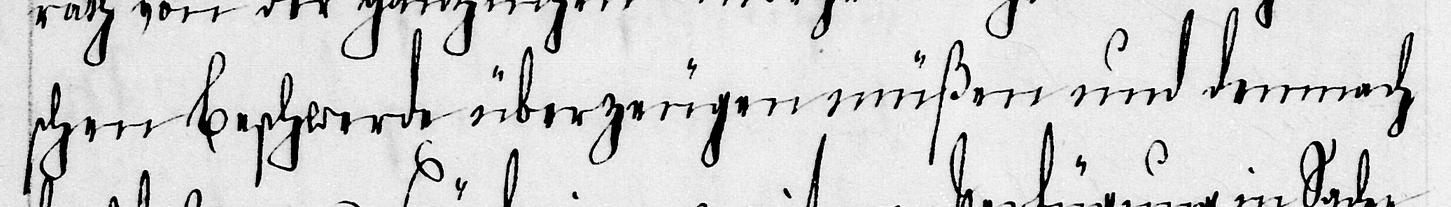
schen Beschwerde überzeugen müßen und demnach
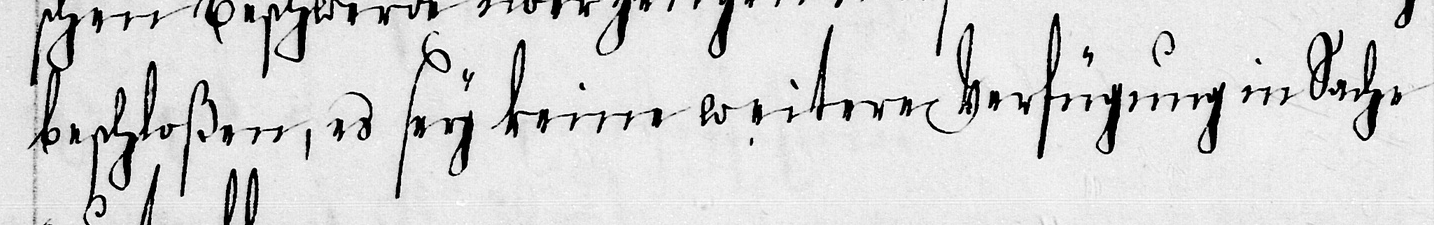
beschloßen, es sey keine weitere Verfügung in Sache
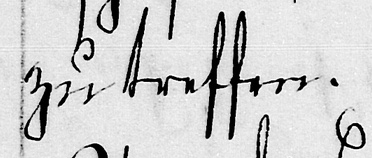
zu treffen.
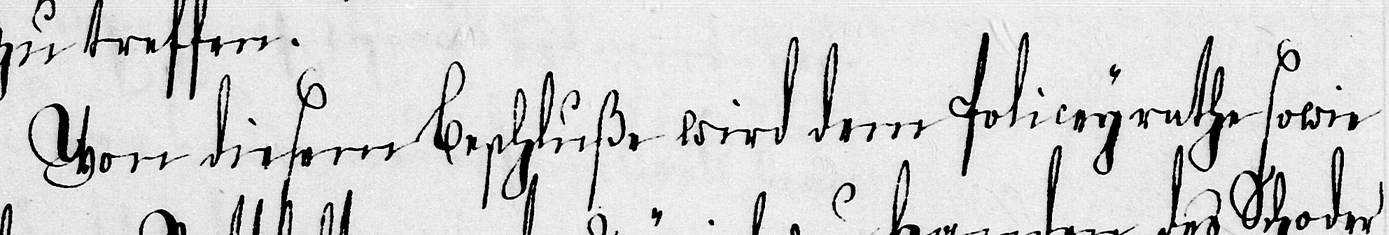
Von diesem Beschluße wird dem Policeyrathe sowie
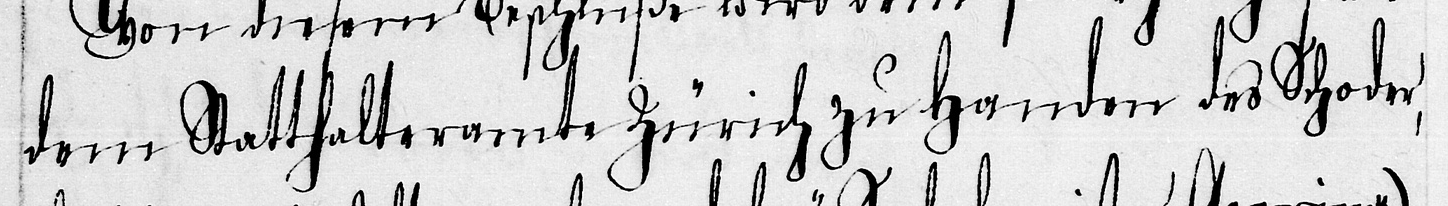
dem Statthalteramte Zürich zu Handen des Schoder,
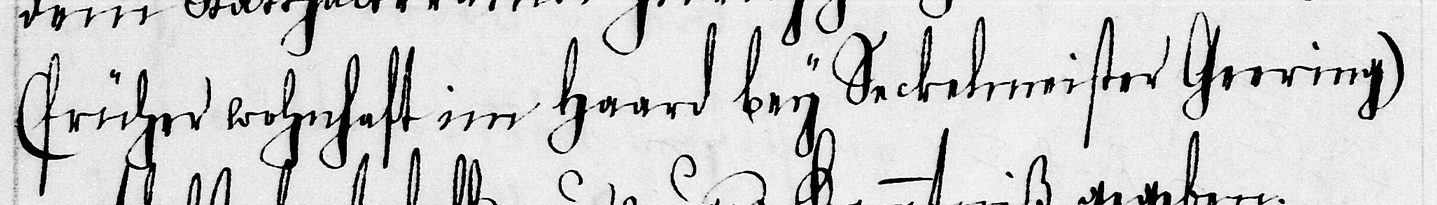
(früher wohnhaft im Haard bey Seckelmeister Geering)
